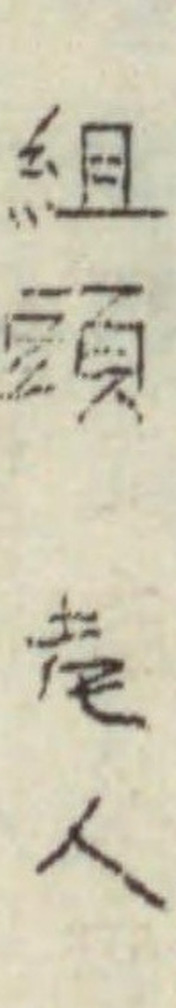組頭壱人
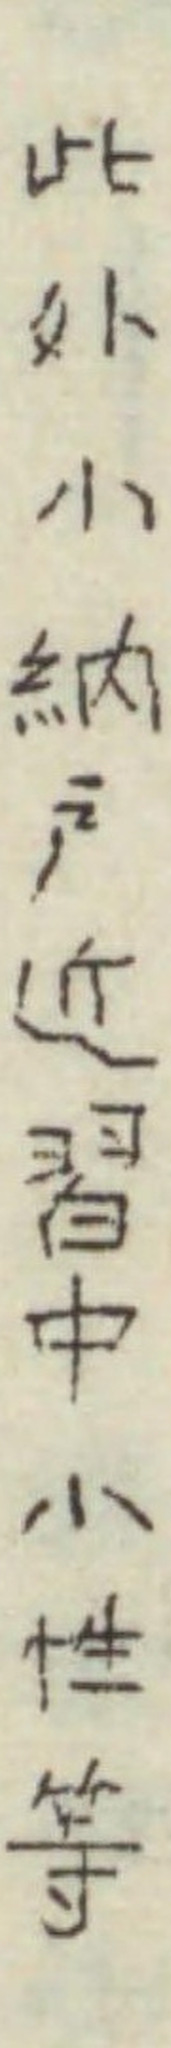此外小納戸近習中小姓等
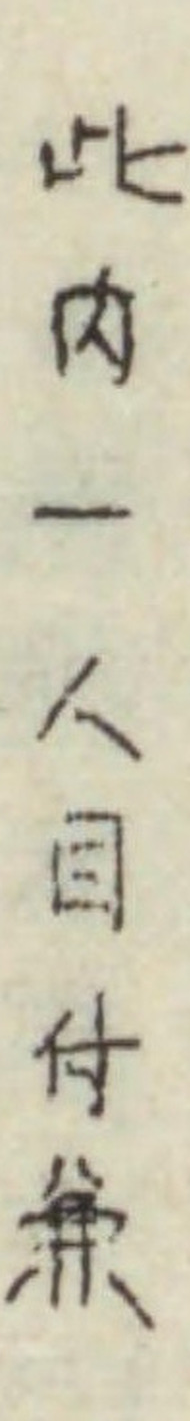此内一人目付兼
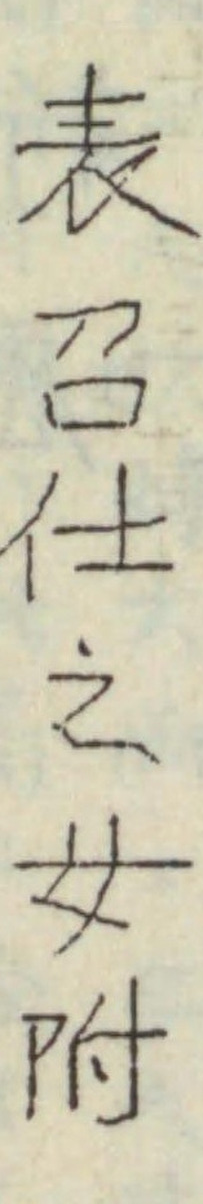表召使之女付
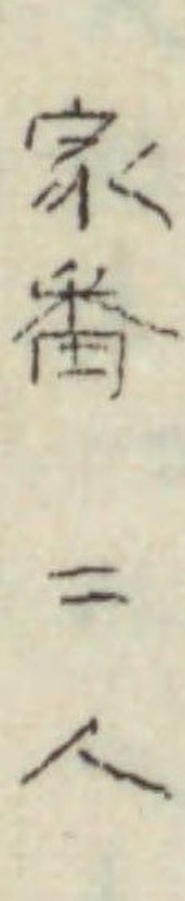泉番二人
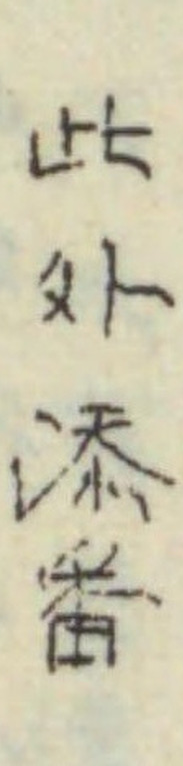此外添番

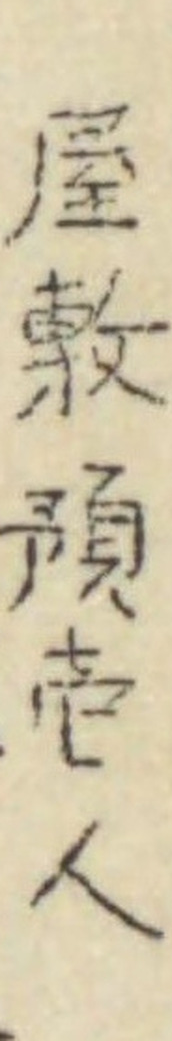屋敷預壱人
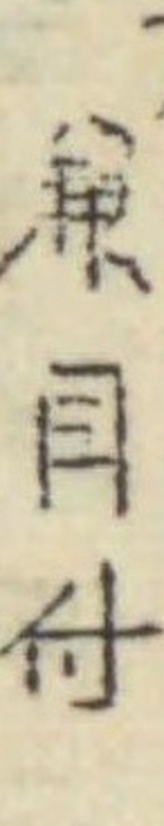兼目付
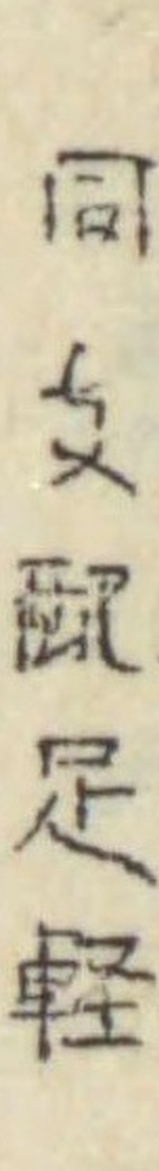弓同支配足軽
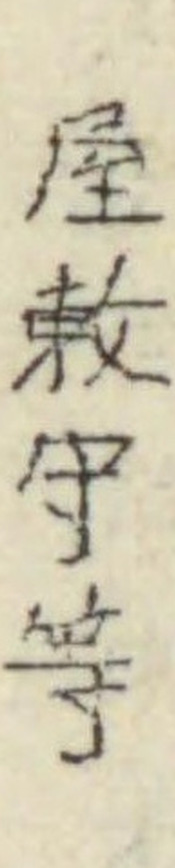屋敷守等
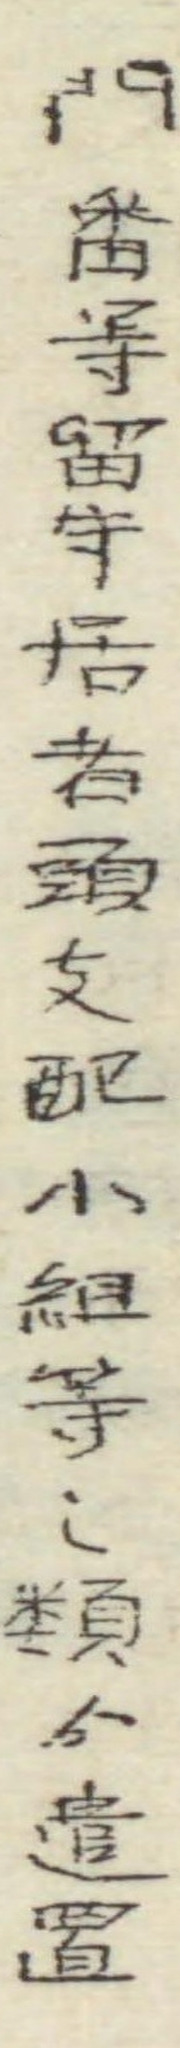門番等留守居者頭支配小組ら等之類ゟ遣置
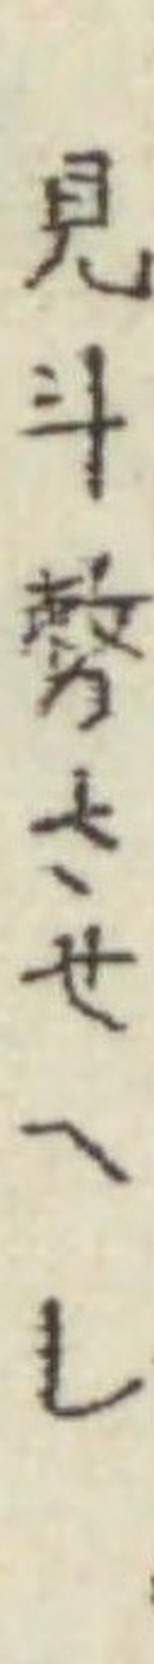見斗務させへし
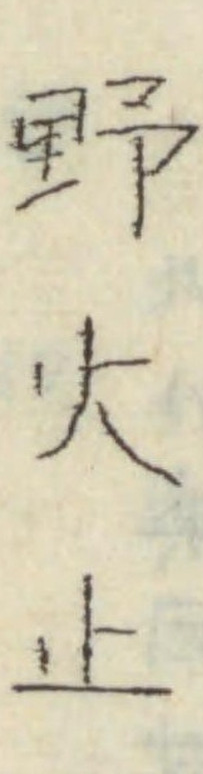野火止
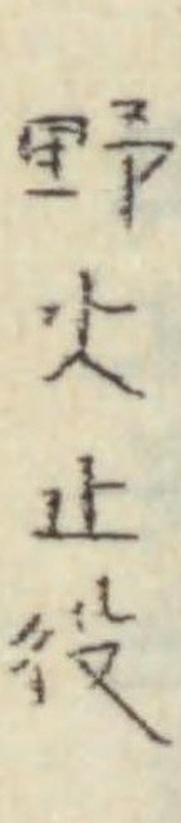野火止役
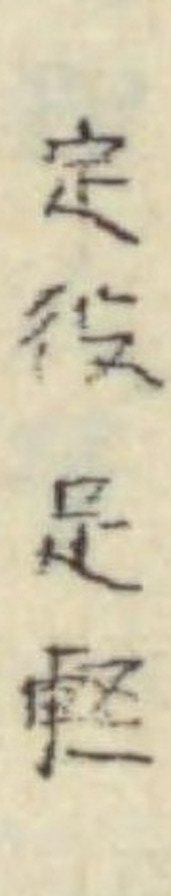定役足軽
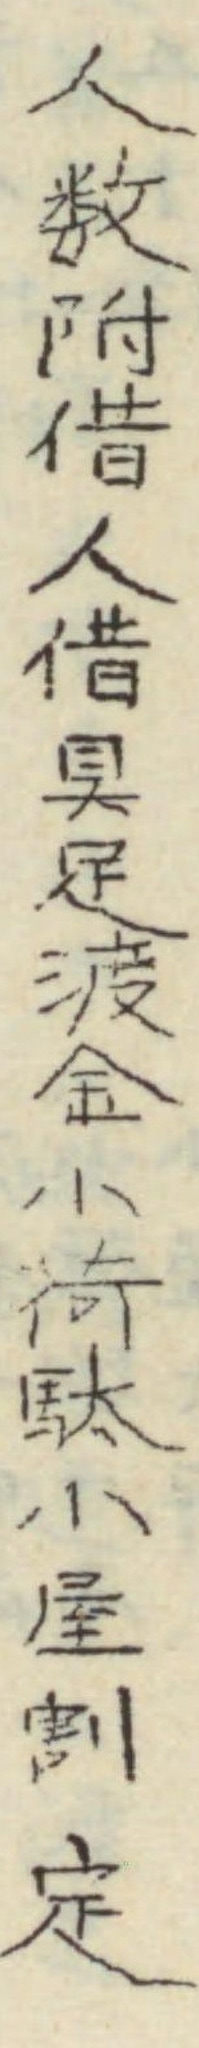人数附借人借具足渡金小荷駄小屋割定
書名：三河吉田藩動員史料
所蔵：国立国会図書館 National Diet Library, JAPAN
